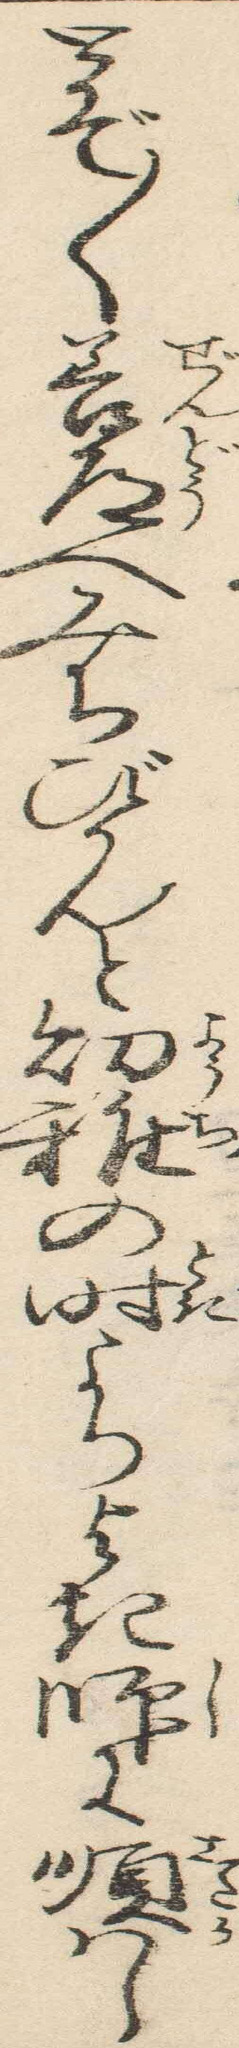とぞ〳〵善道へみちびかんと幼稚の時よりよき師に順はし
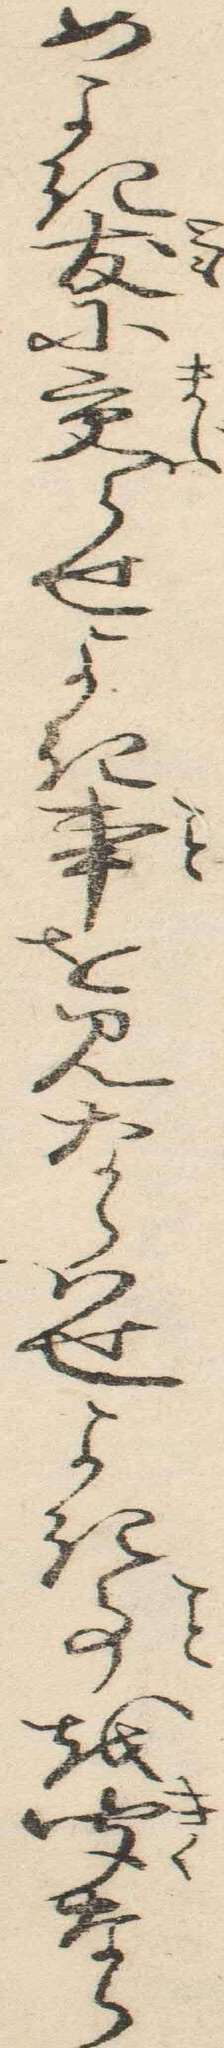めよき友に交らせよき事を見ならはせよき事を聞なら
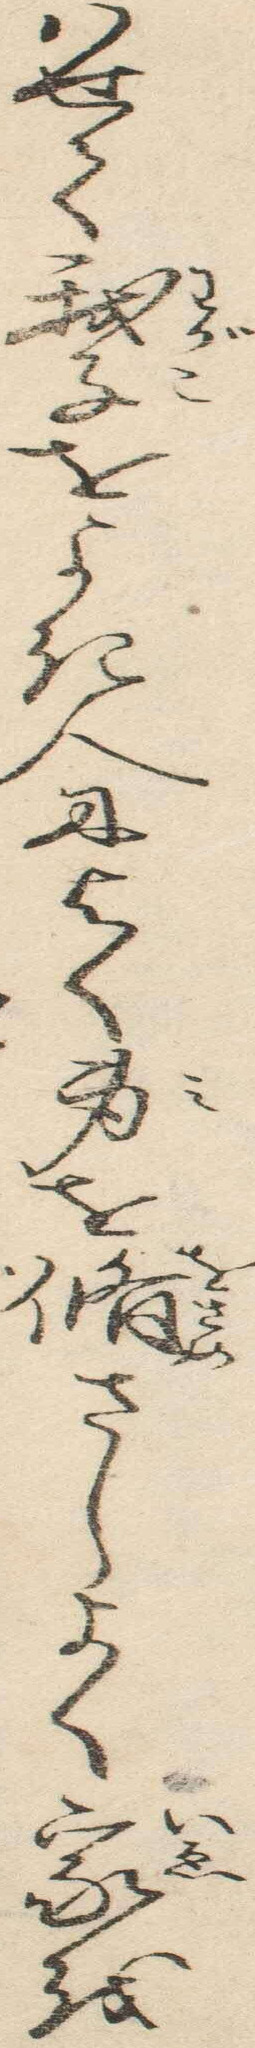はせて我子をよき人によく身を脩さしよく家を
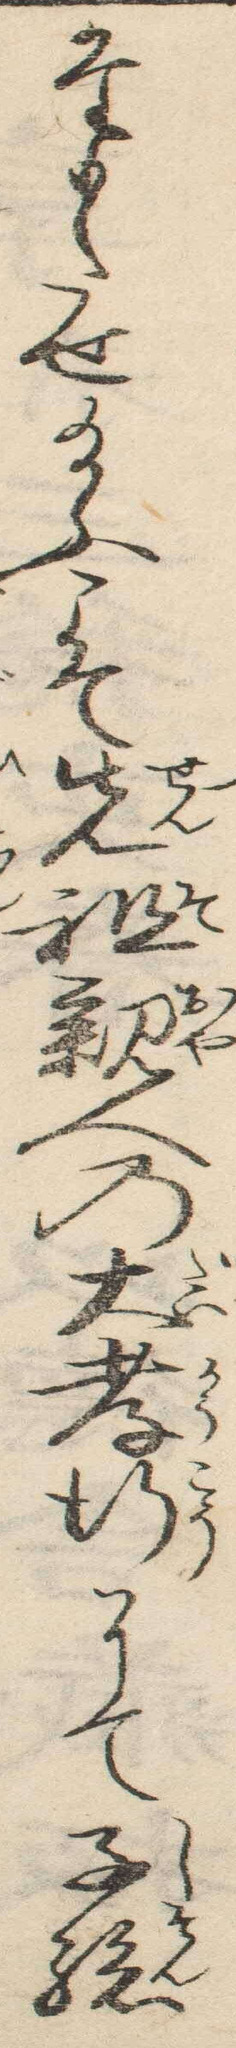たもたせ給ふこそ先祖親人の大孝行にて子孫
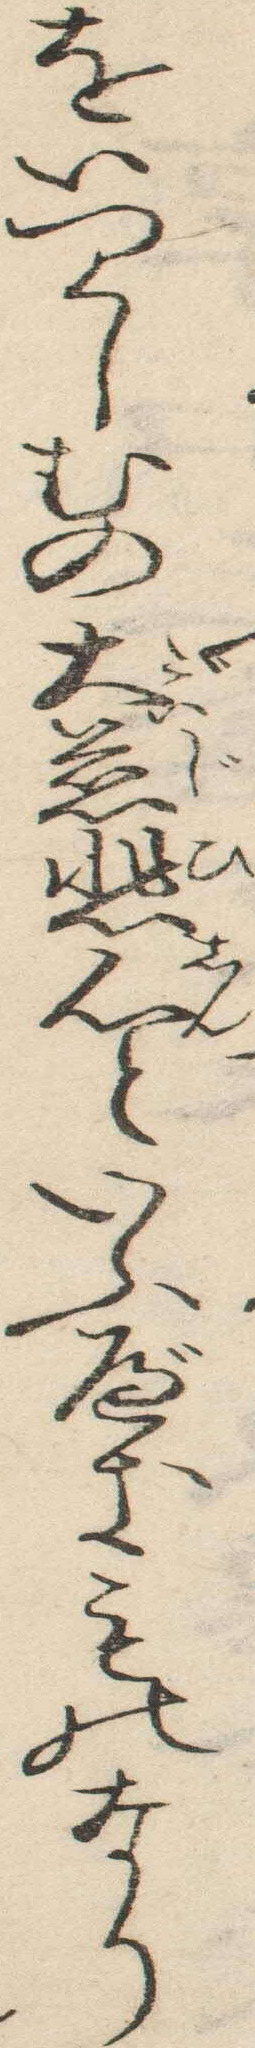をいつくしむの大慈悲心といふべきものなり
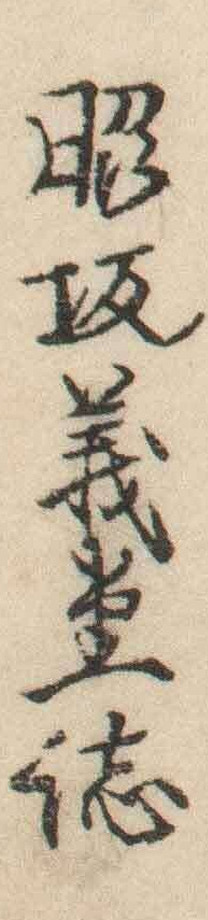脇坂義堂誌

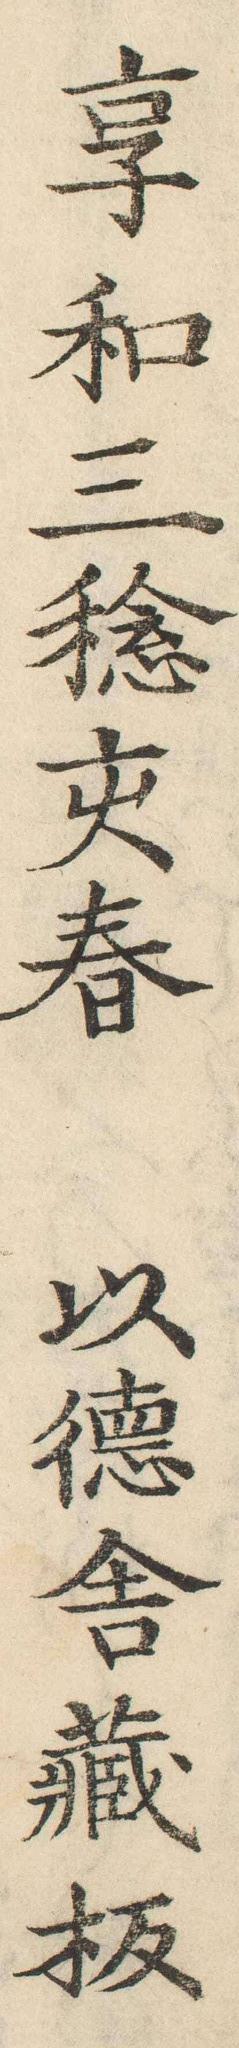享和三稔亥春以徳舎蔵板
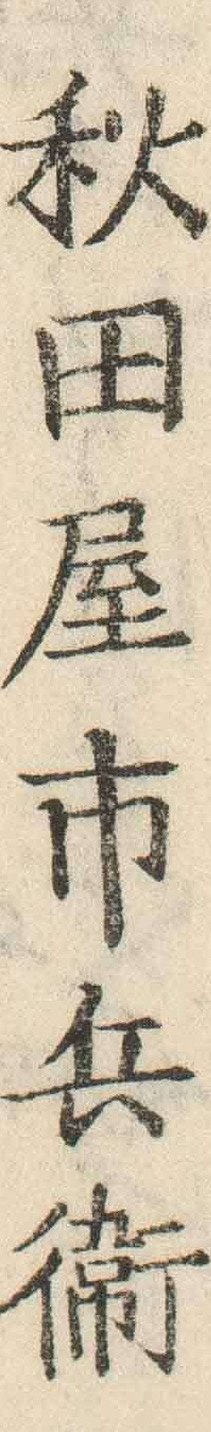秋田屋市兵衛
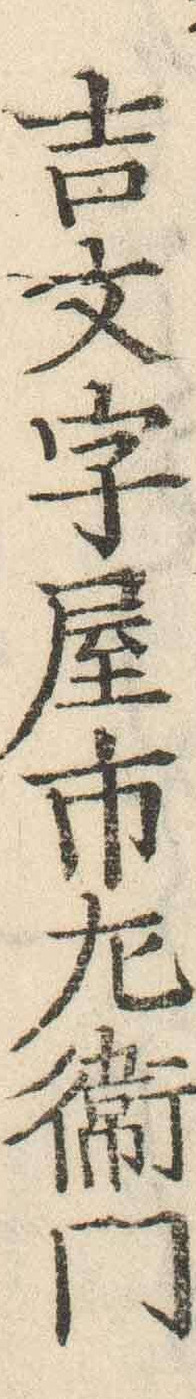吉文字屋市左衛門
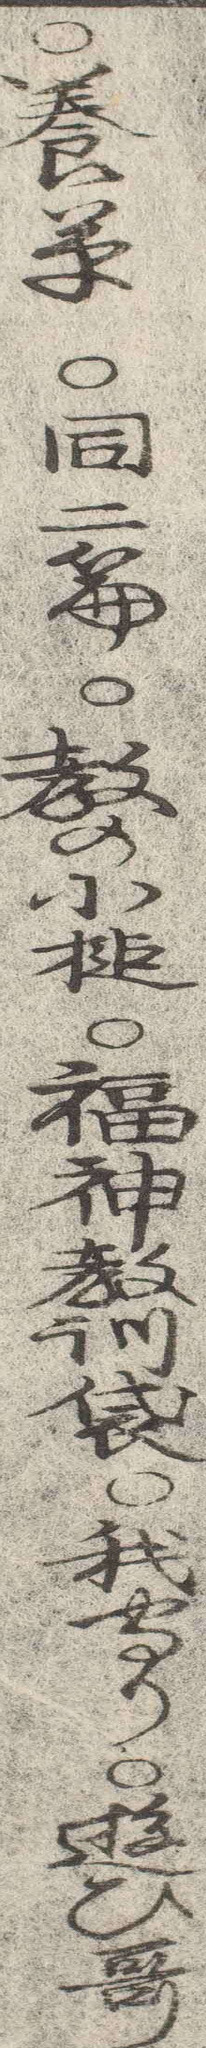○養草○同二篇○教の小槌○福神教訓袋○我守り○遊ひ哥
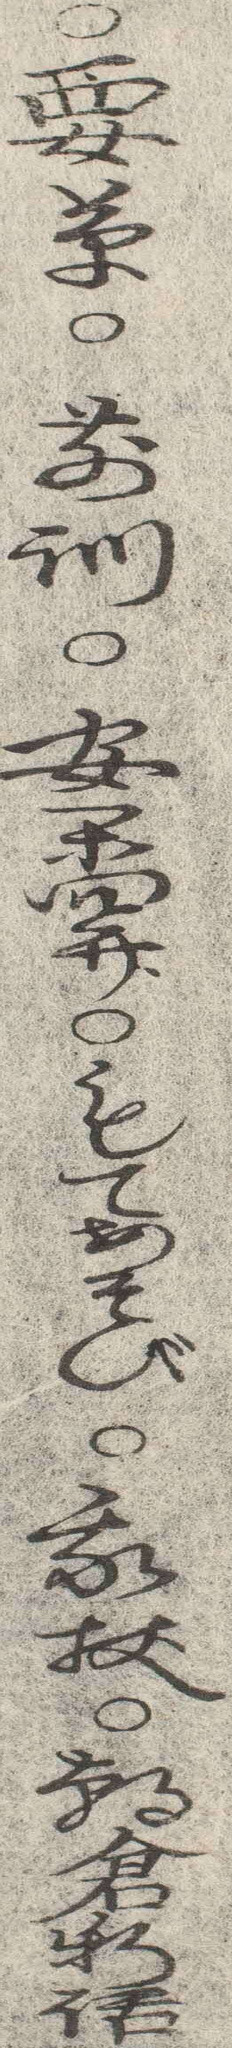○要草○前訓○安楽問弁○もてあそび○我杖○朝倉新話
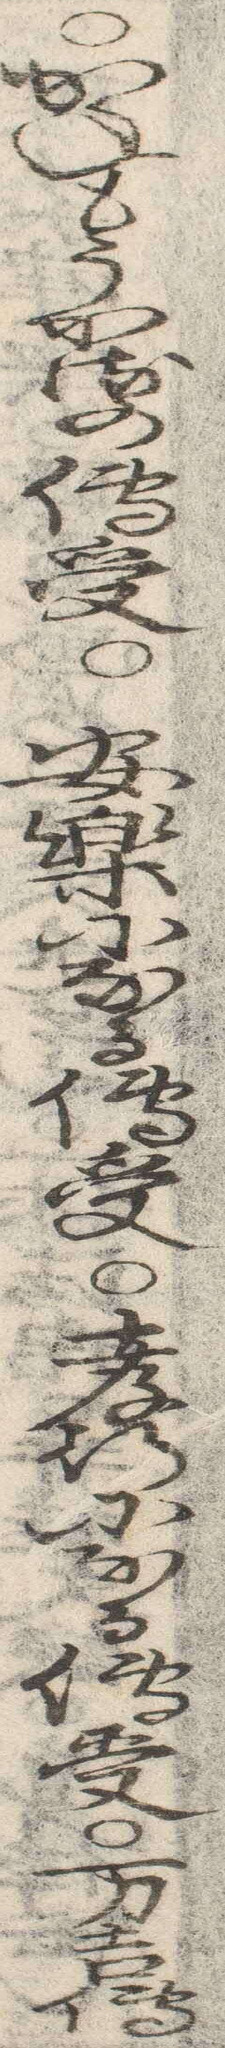○かねもうかるの伝受○安楽になる伝受○孝行になる伝受○万吉伝
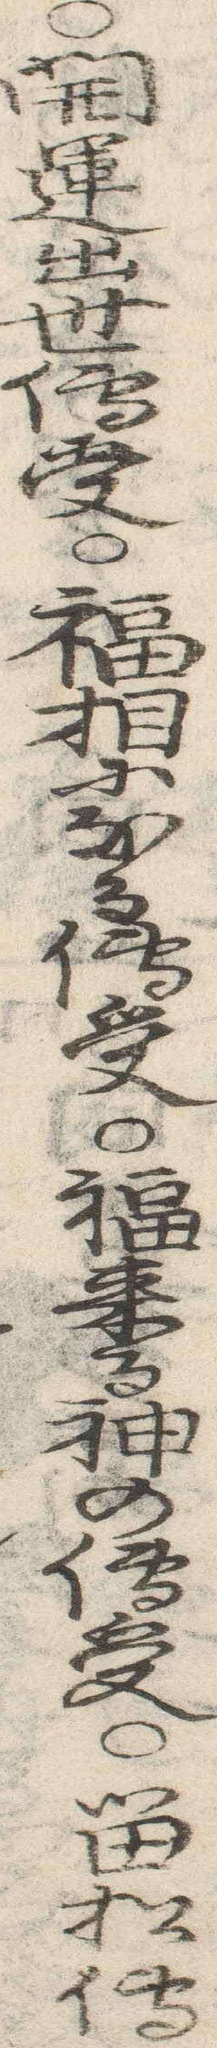○開運出世伝受○福相になる伝受○福来る神の伝受○留松伝
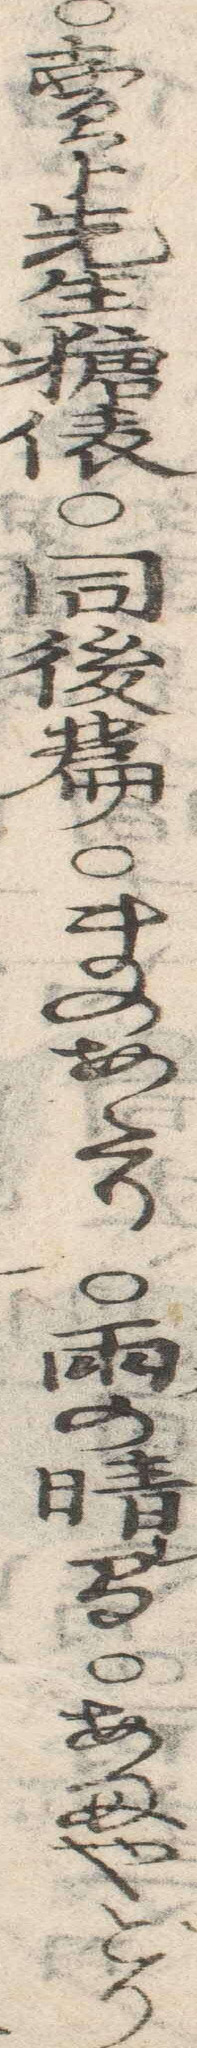○売卜先生糖俵○同後篇○まのあたり○雨の晴間○あまやどり
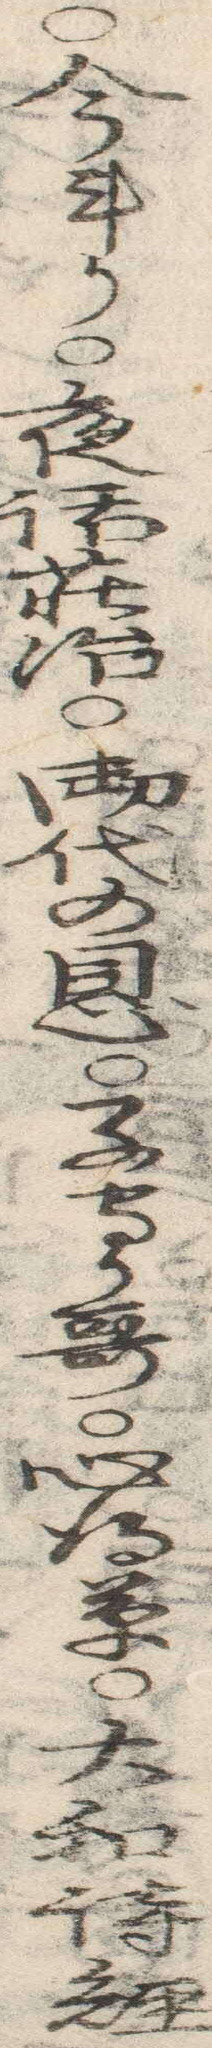○今計り○夜話荘治○御代の恩○子守り哥○心得草○大和詩経
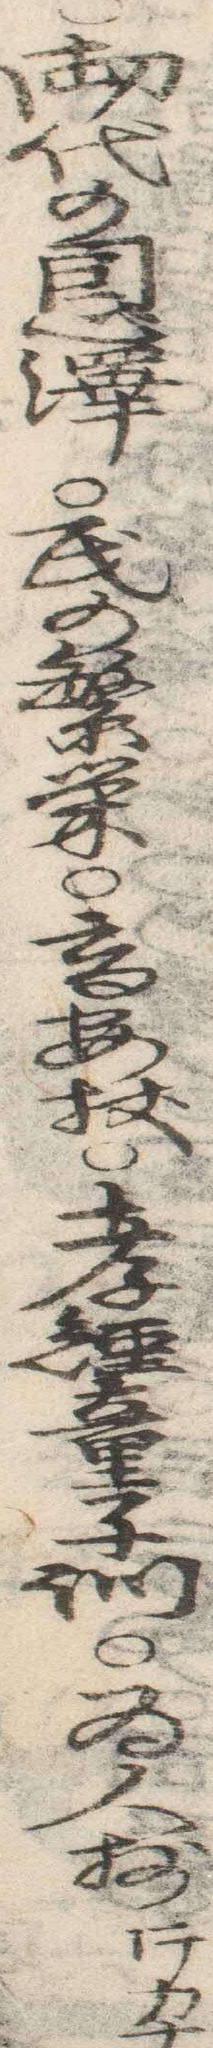○御代の恩沢○民の繁栄○盲安杖○孝経童子訓○為人抄片カナ
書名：撫育草
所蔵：東京学芸大学附属図書館 国文学研究資料館
